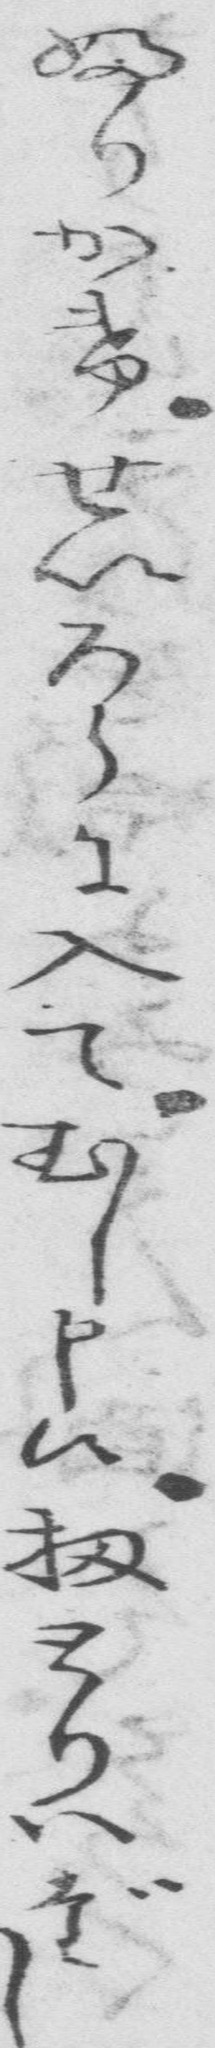ふりかけ。せいろうに入て。むし申候。扨とりいだし
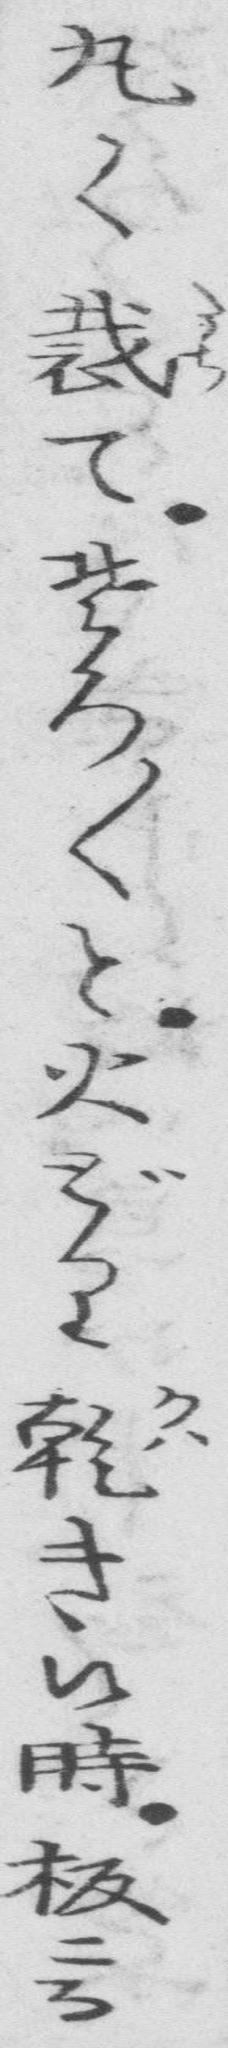丸く裁て。そろ〳〵と、火どり乾き候時。板に而
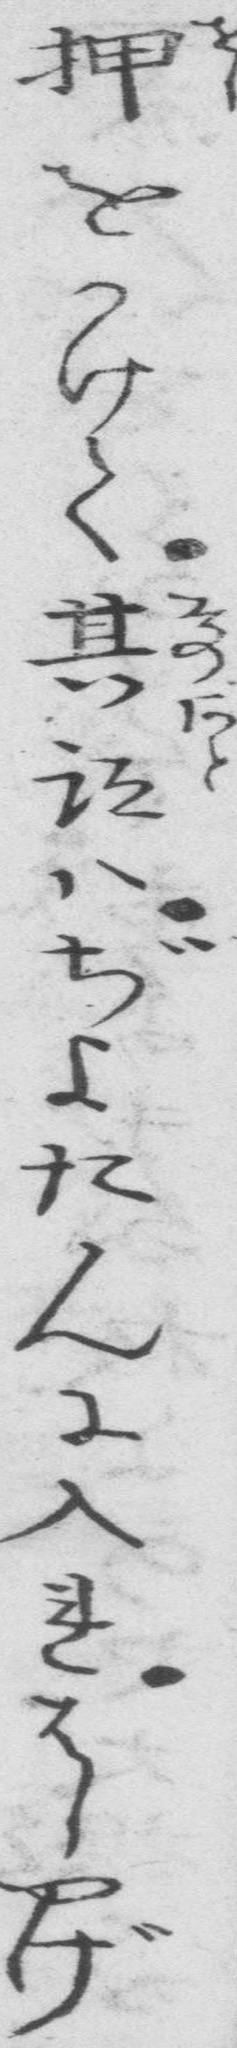押をつけて。其跡は。ぢよたんに入れ。はしやげ
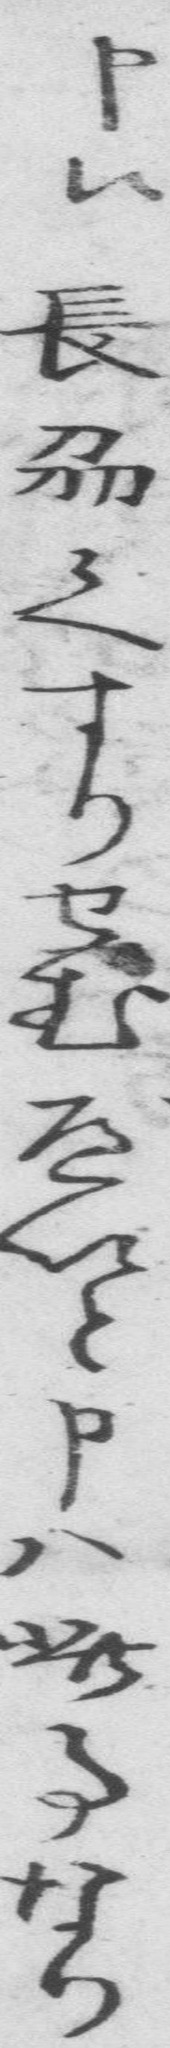申候。長州之すりせむべいと申は。此事なり

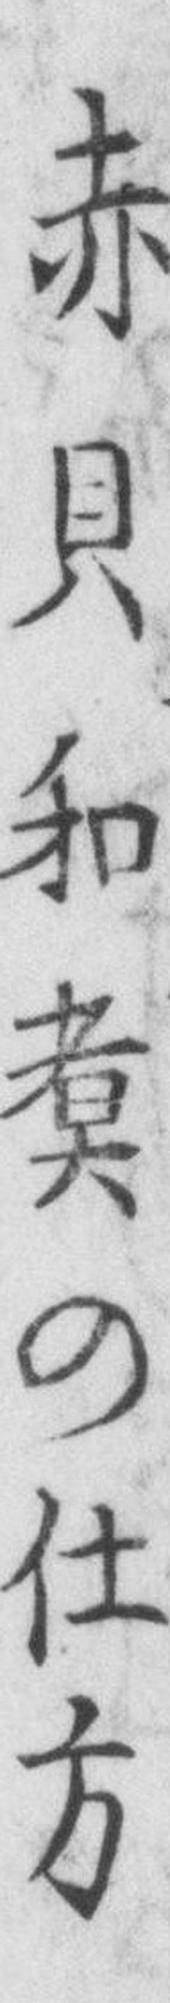赤貝和煮の仕方
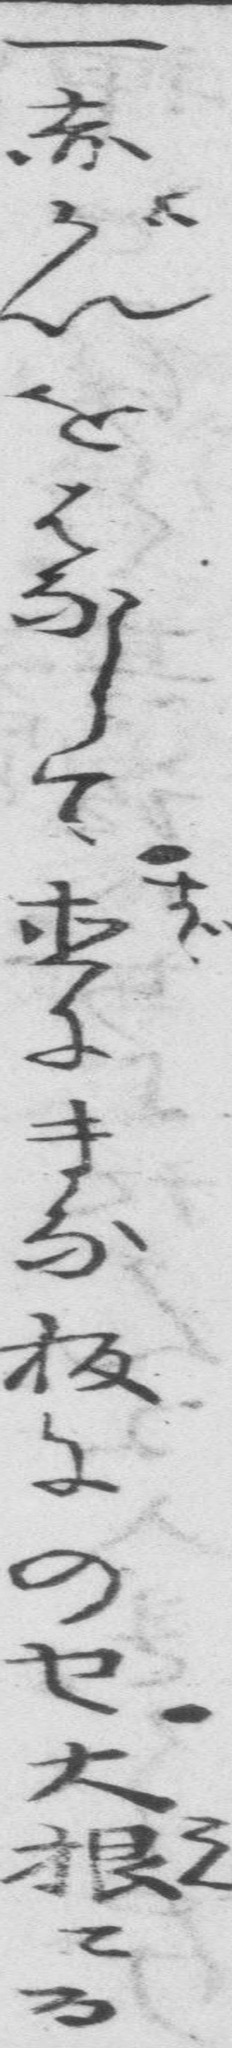一赤がいをはなして。直にまな板にのせ。大根に而
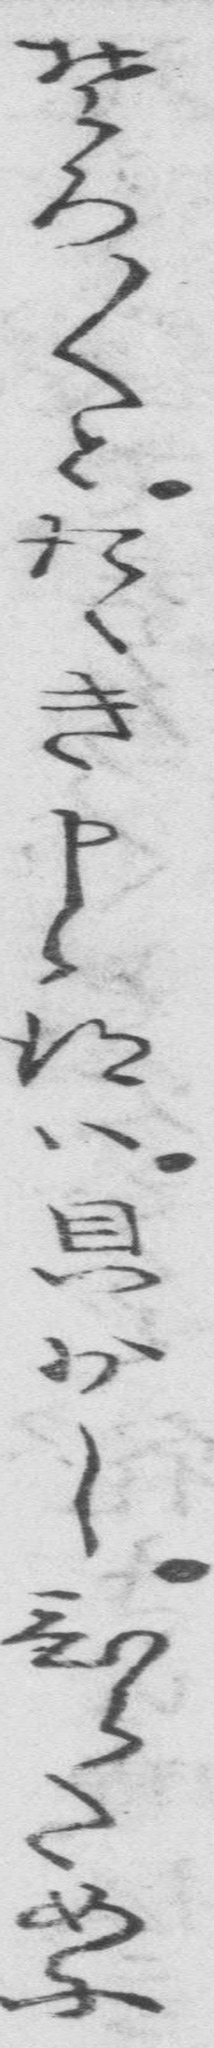そろ〳〵と。たゝき申候得は。貝少し。ひらために
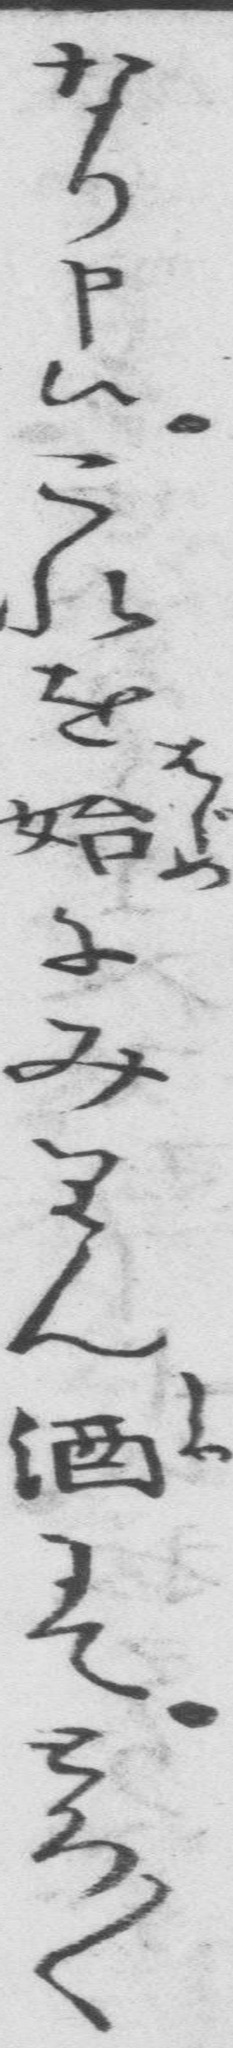なり申候。これを始にみりん酒にて。とろ〳〵
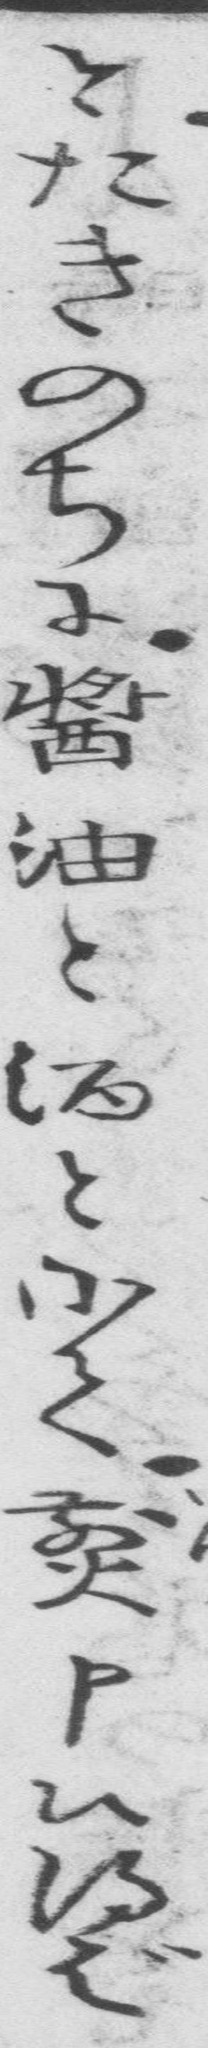と。たきのちに。醤油と酒とにて。煎申候得ば
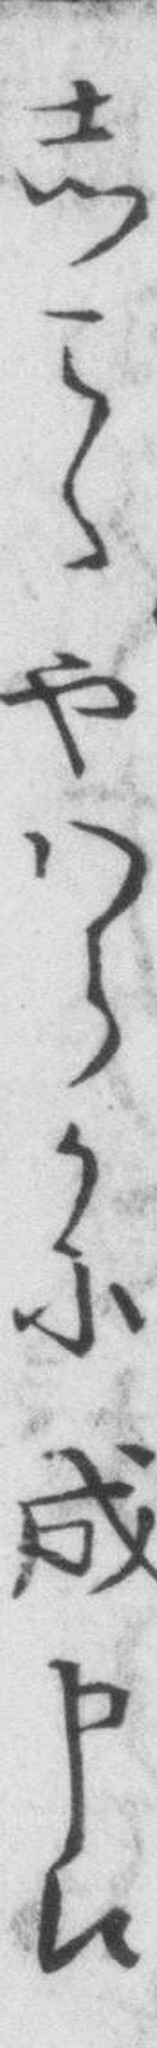しごく。やはらかに成申候
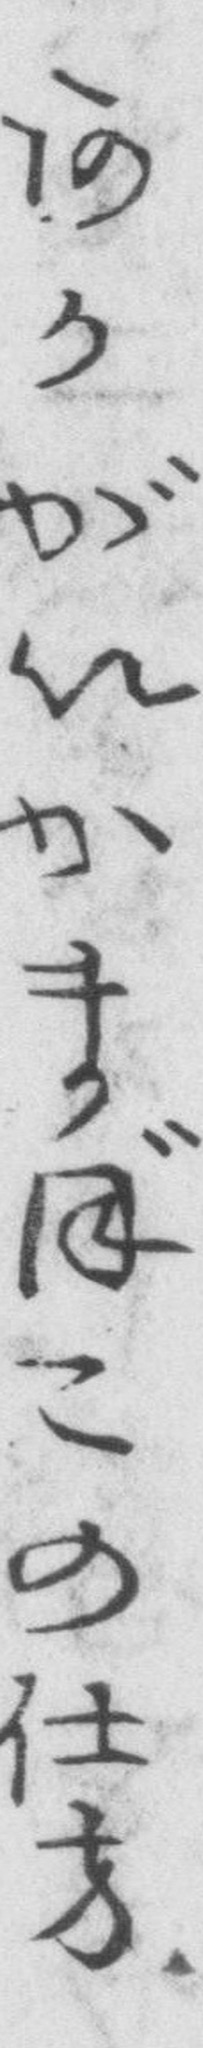あかがいかまぼこの仕方
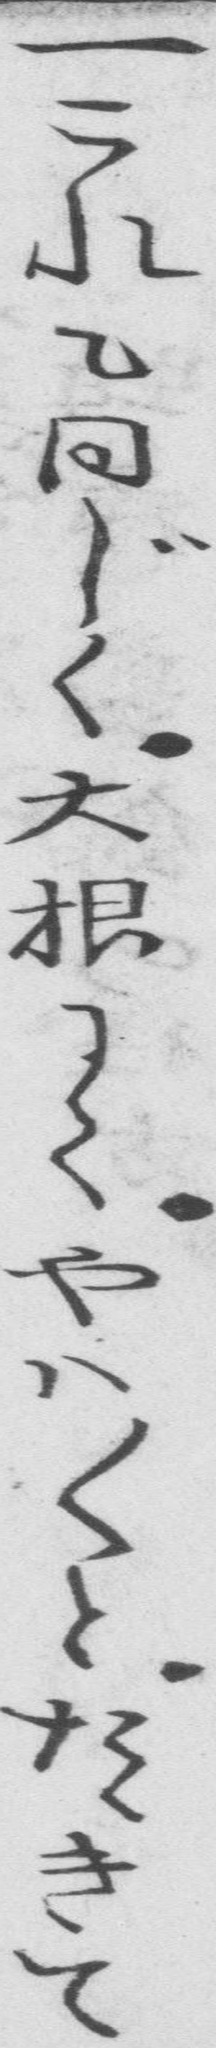一これも同じく。大根にて。やは〳〵と。たゝきて
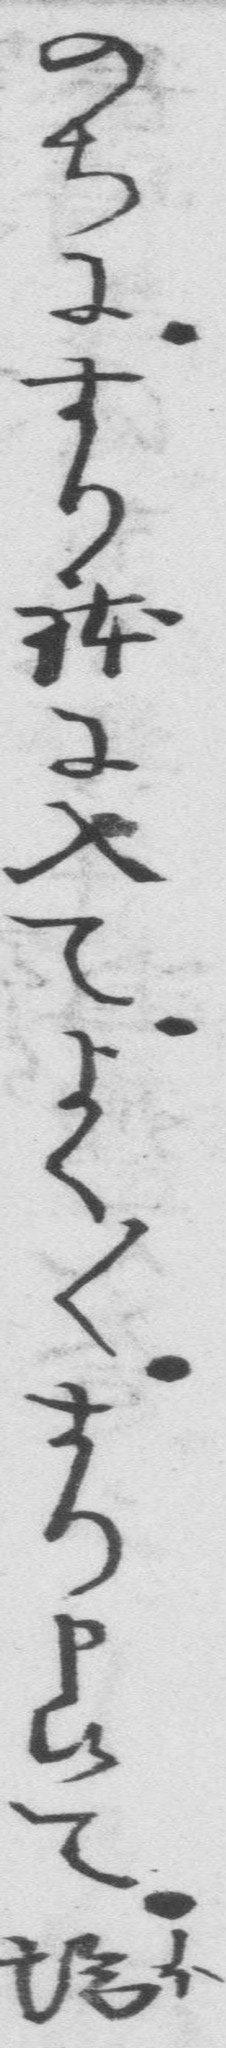のちに。すり鉢に入て。よく〳〵。すり申候て。塩
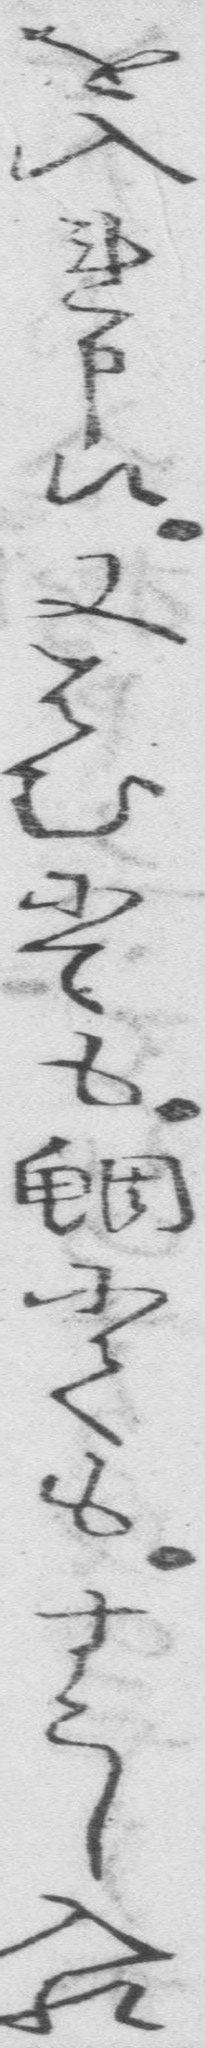を入れ申候。又はむにても。鯛にても。すこし入れ
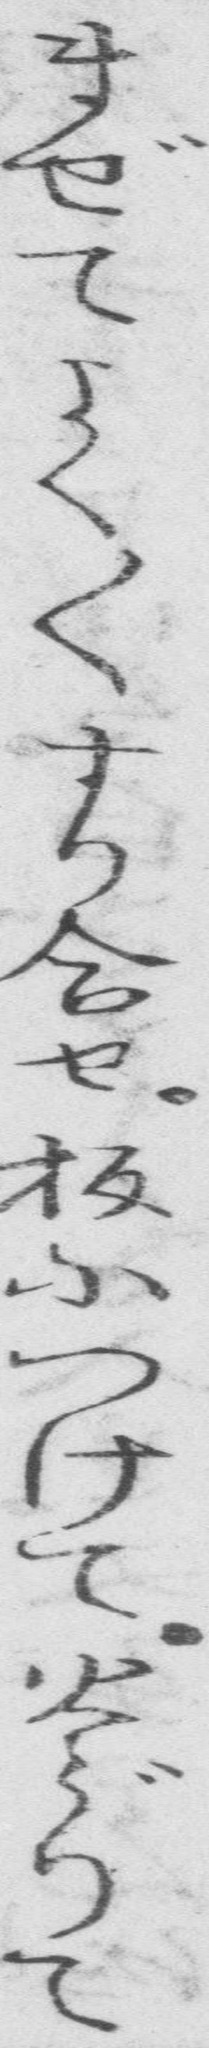まぜてよく〳〵すり合せ。板につけて。火どりて
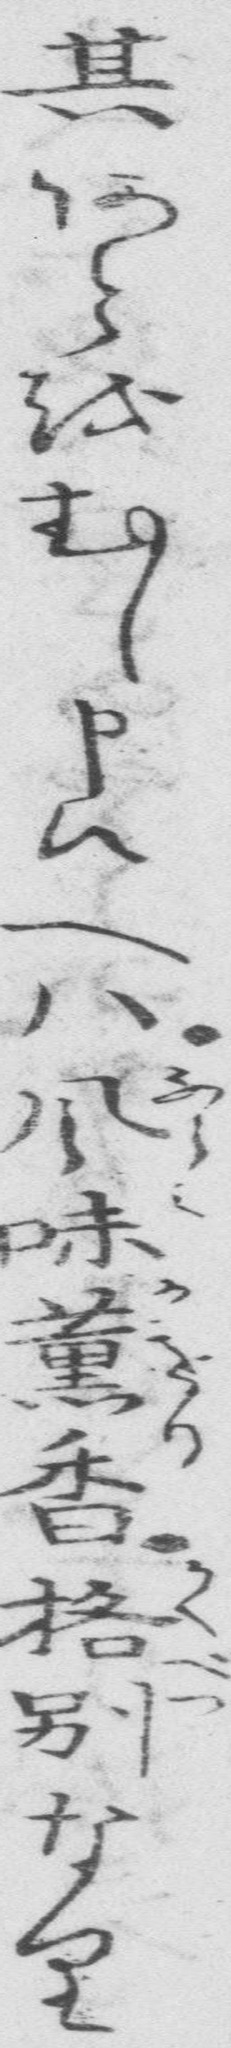其あとをむし申候へは。風味薫香。格別なり
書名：萬寳料理秘密箱
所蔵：大阪府立大学学術情報センター 国文学研究資料館
